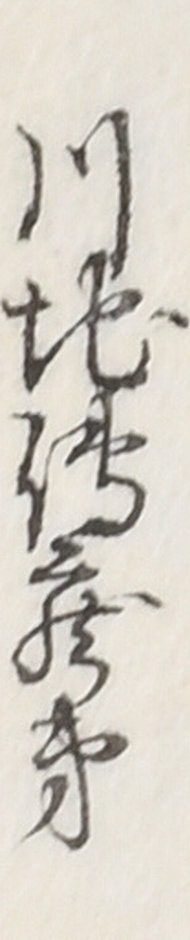川地伝蔵弟
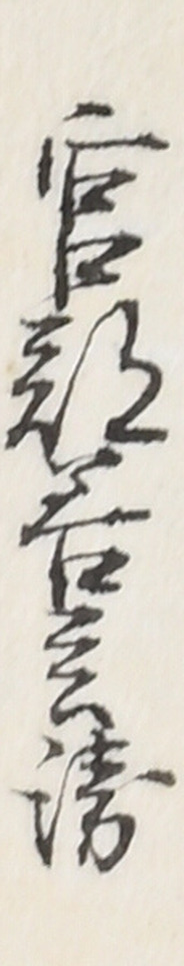宮部善兵衛
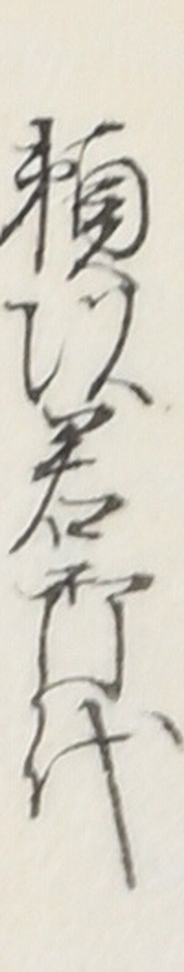頼以君御代
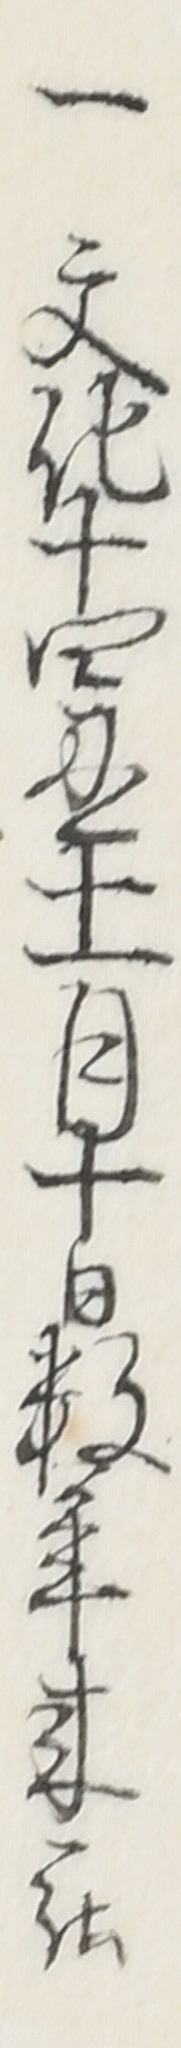一文化十四丑十一月十日数年来被
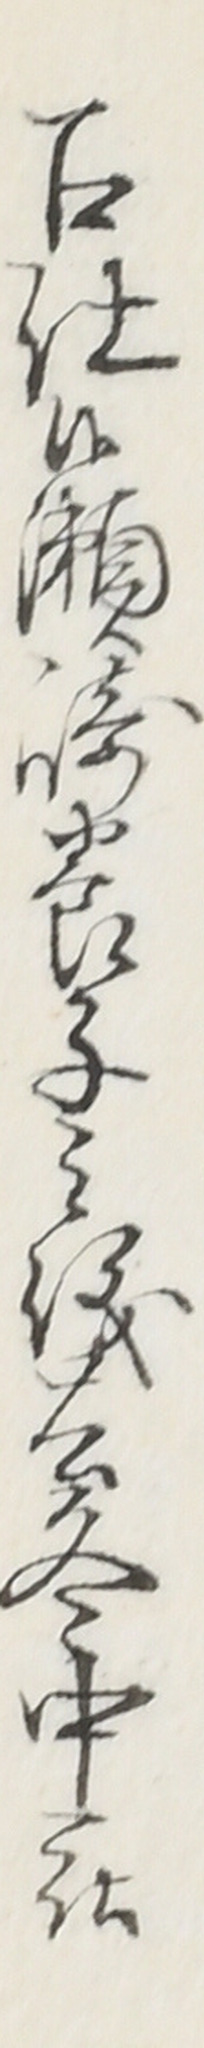召仕候瀬崎養子之儀去冬中被
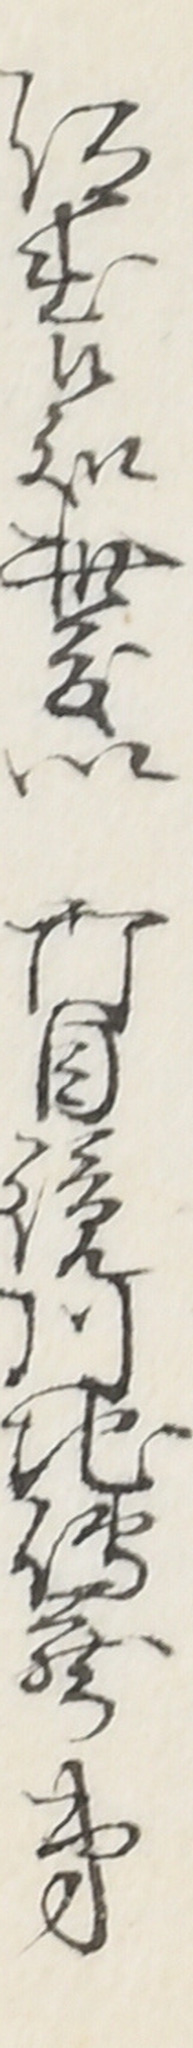仰出候処此度以御目鏡川地伝蔵弟
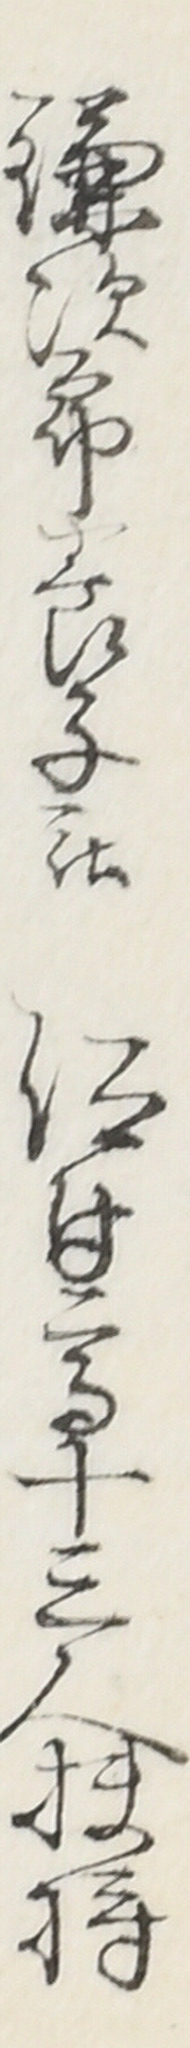鎌次郎養子被仰付高十三人扶持
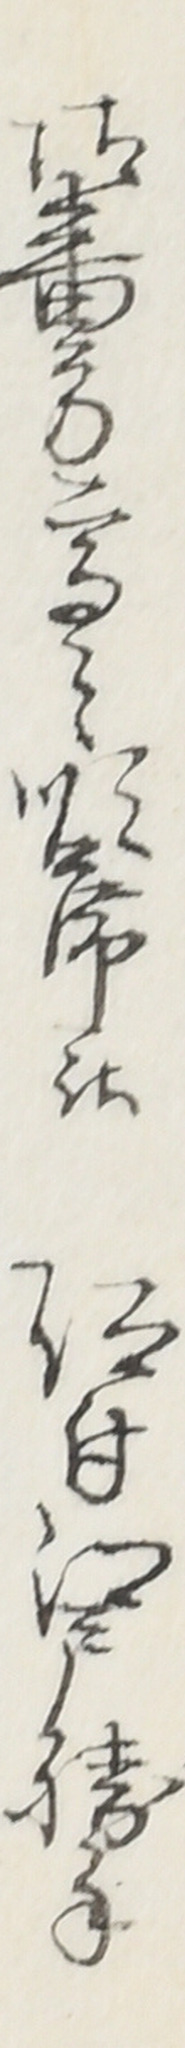御番方高之順席被仰付江戸勝手
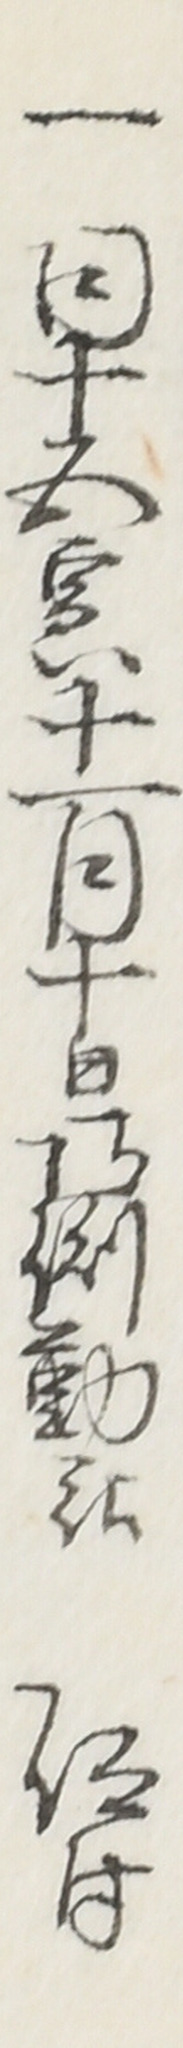一同十五寅十一月十日御側勤被仰付
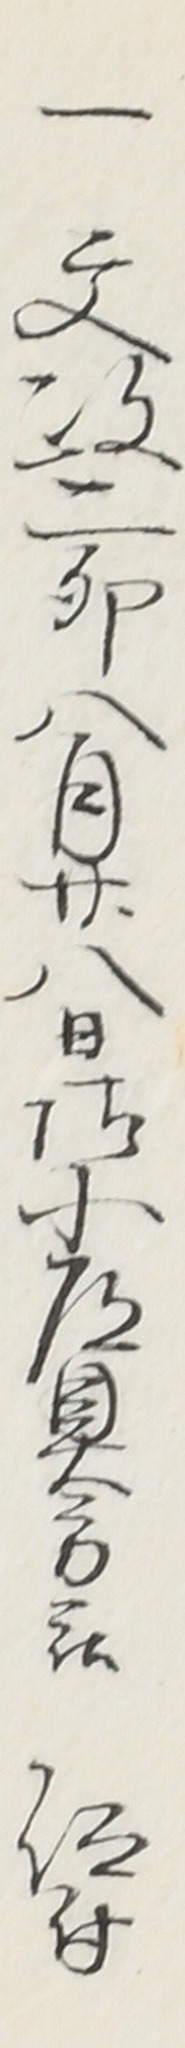一文政二卯八月廿八日御小道具方被仰付
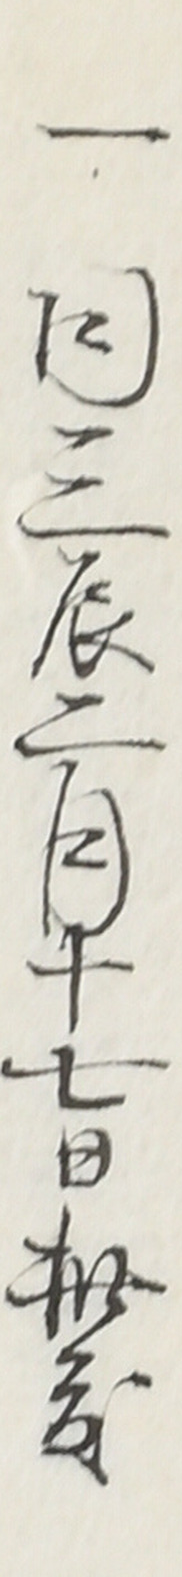一同三辰二月十七日此度
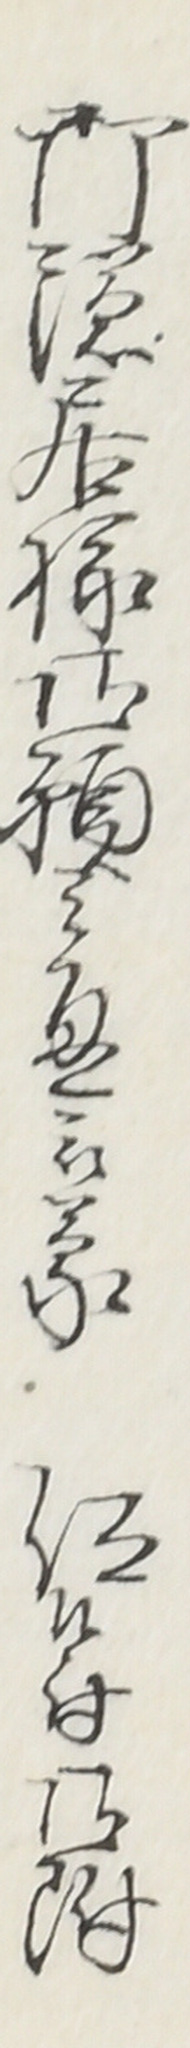御隠居様御願之通被蒙仰候付御附
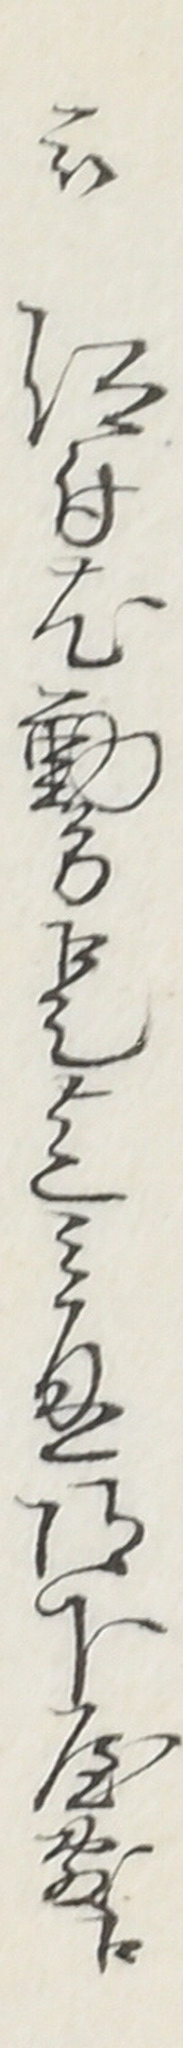被仰付尤勤方是迄之通御下屋敷江
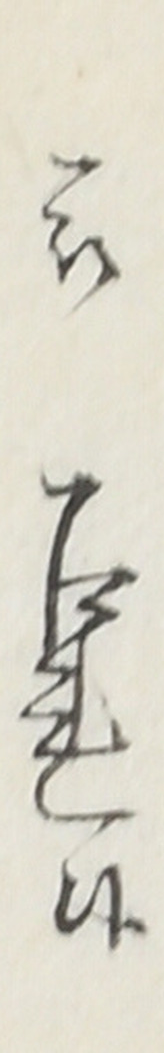被召連候
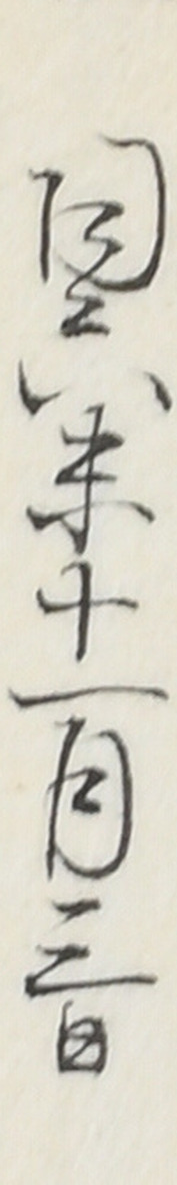一同六未十一月三日
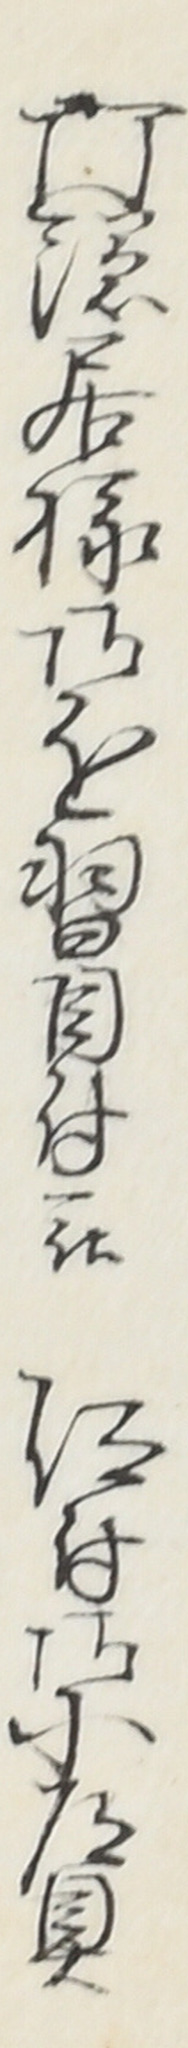御隠居様御近習目付被仰付御小道具
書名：給人諸士勤仕録（七）
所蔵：伊那市立高遠町図書館・合同会社AMANE
